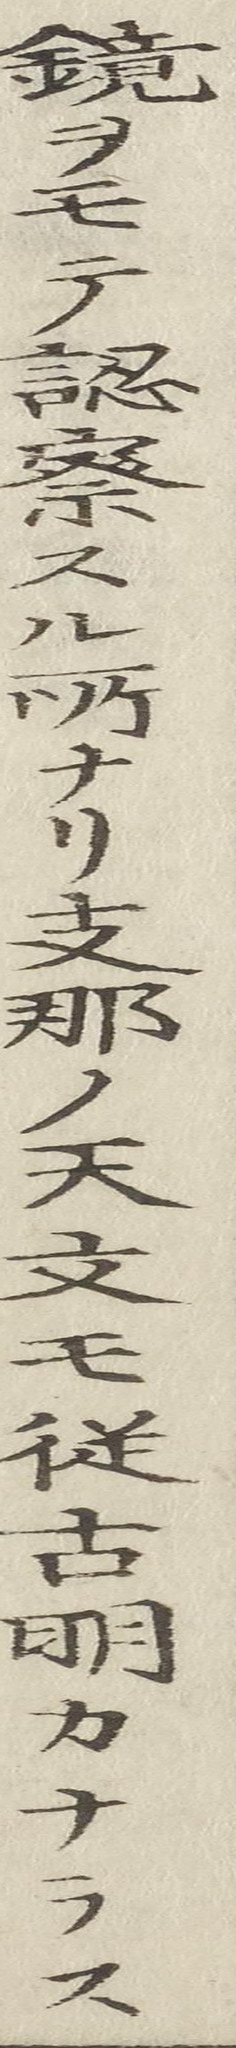鏡ヲモテ認察スル所ナリ支那ノ天文モ従古明カナラス
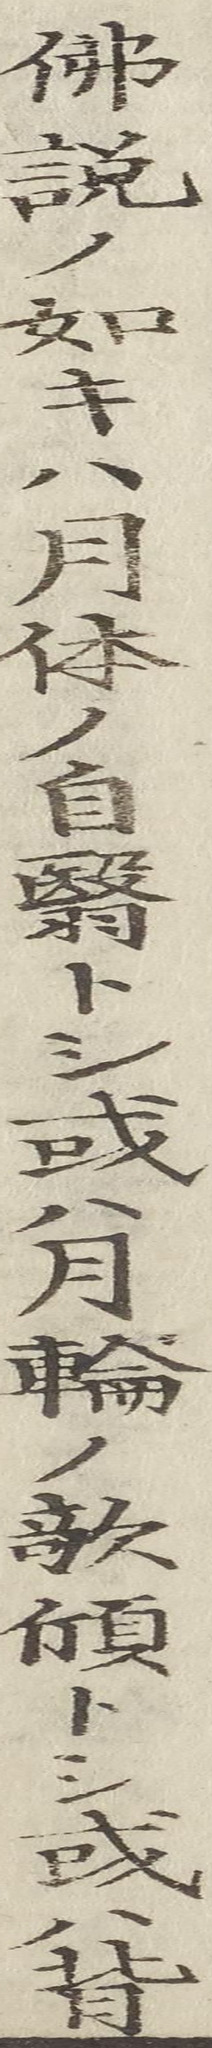仏説ノ如キハ月体ノ自翳トシ或ハ月輪ノ歌頎トシ或ハ背

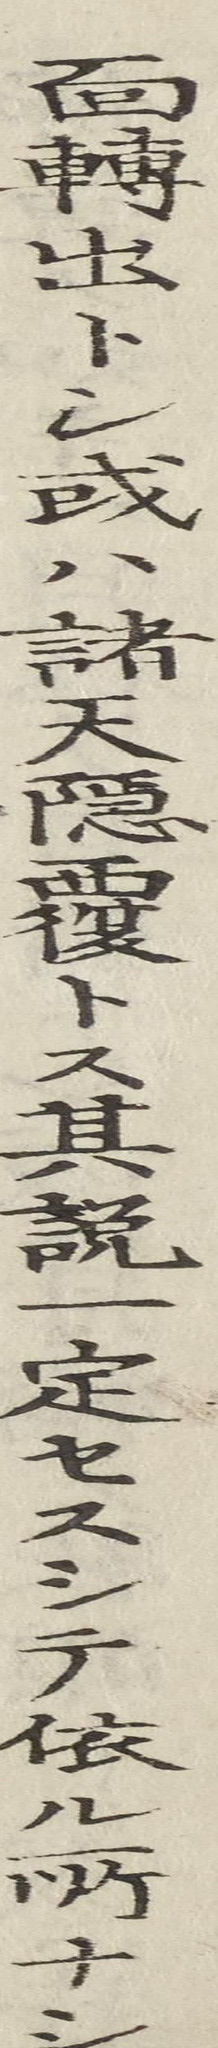面転出トシ或ハ諸天隠覆トス其説一定セスシテ依ル所ナシ
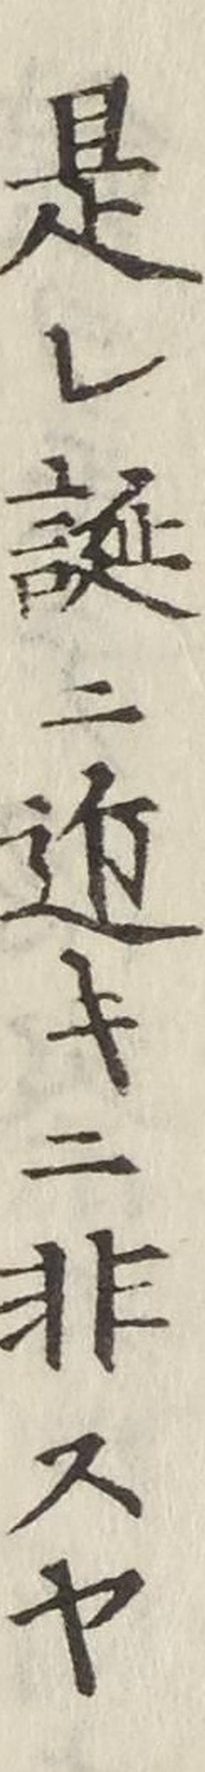是レ誕ニ近キニ非スヤ
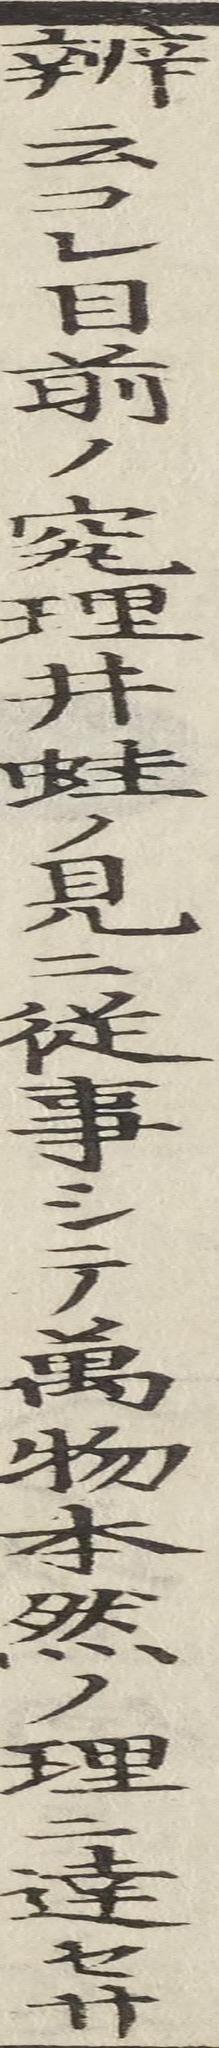弁云コレ目前ノ究理井蛙ノ見ニ従事シテ万物本然ノ理ニ達セサ
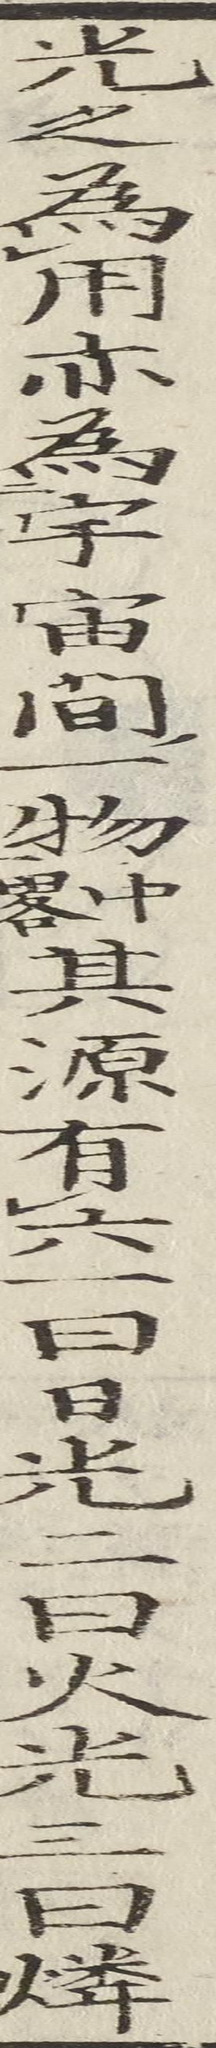光之為用亦為ニ宇宙間一物中略其源有六一日日光二日火光三日燐
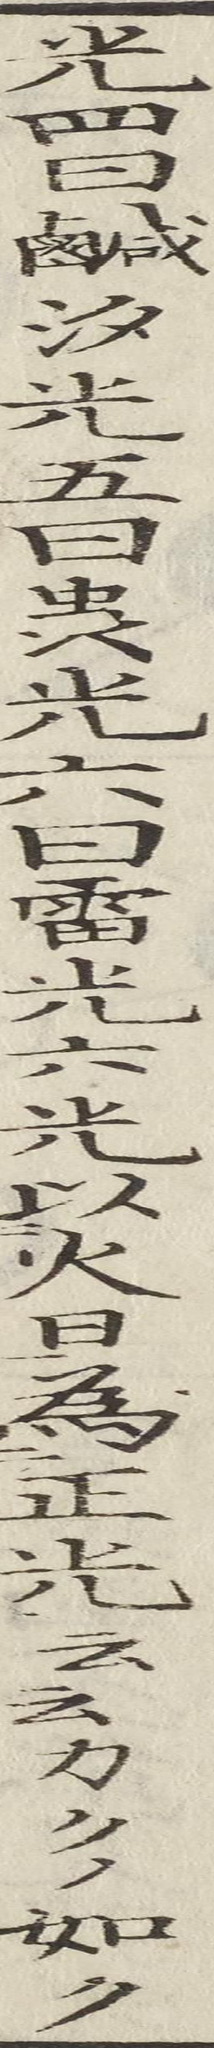光四日鹹汐光五日蟲光六日雷光六光以ニ火日為ニ正光云云カクノ如ク
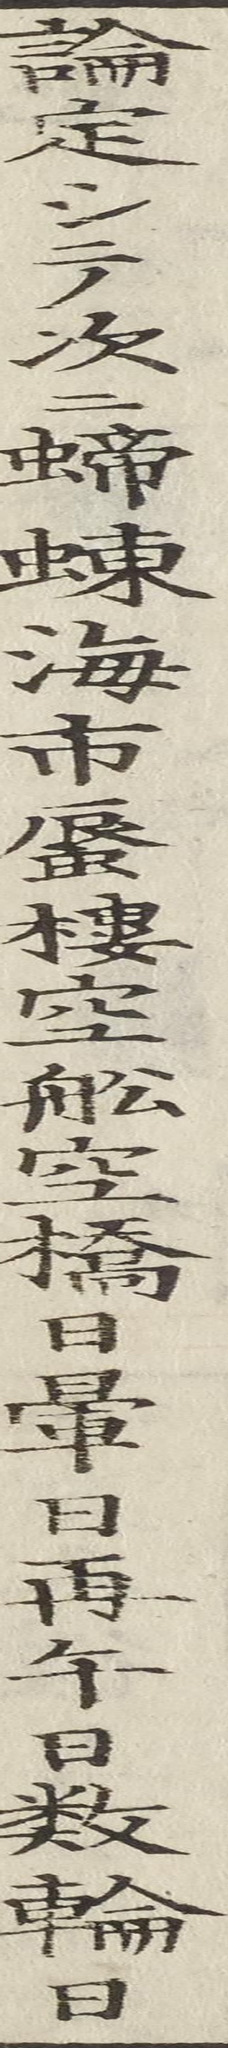論定シテ次ニ蹄蝀海市蜃楼空船空橋日暈日再午日数輪日
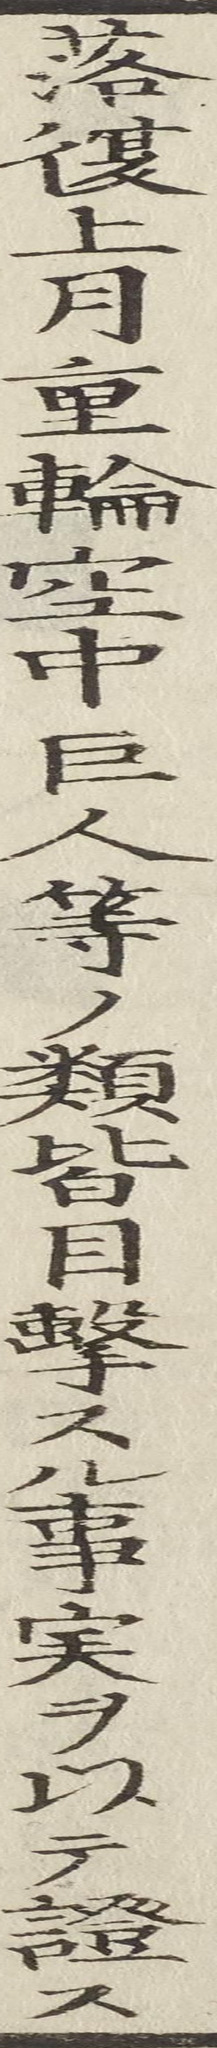落復上月重輪空中巨人等ノ類皆目撃スル事実ヲ以テ證ス
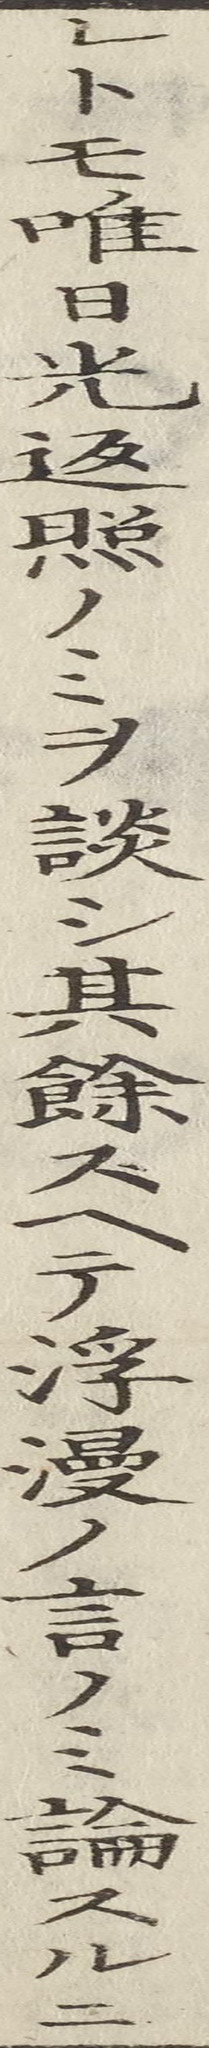レトモ唯日光返照ノミヲ談シ其余スヘテ浮漫ノ言ノミ論スルニ
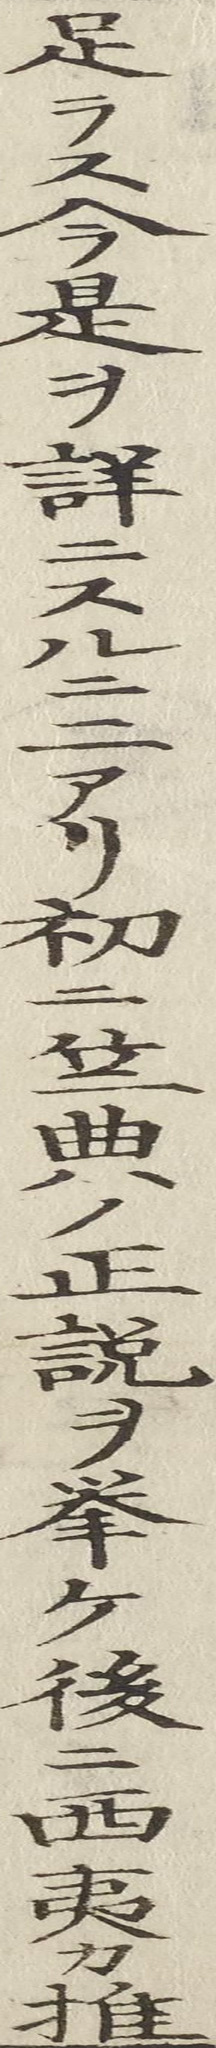足ラス今是ヲ詳ニスルニニアリ初ニ竺典ノ正説ヲ挙ケ後ニ西夷カ推
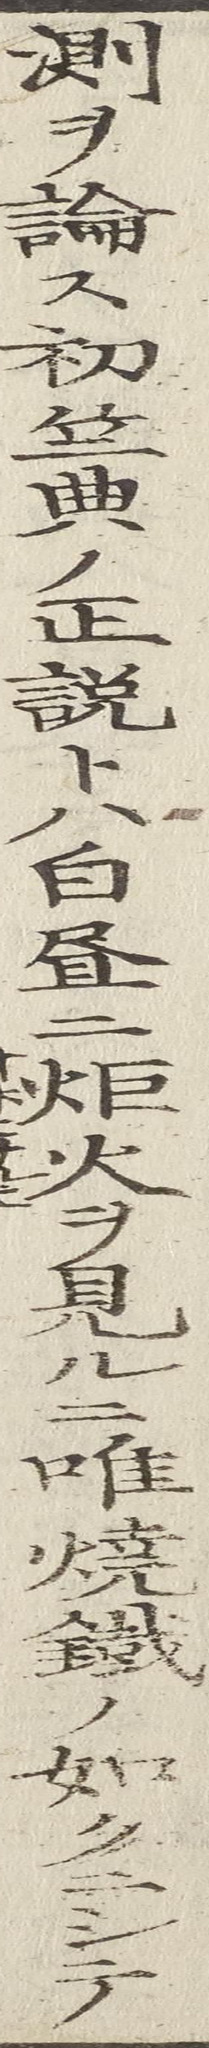測ヲ論ス初竺典ノ正説トハ白昼ニ炬火ヲ見ルニ唯焼鉄ノ如クニシテ
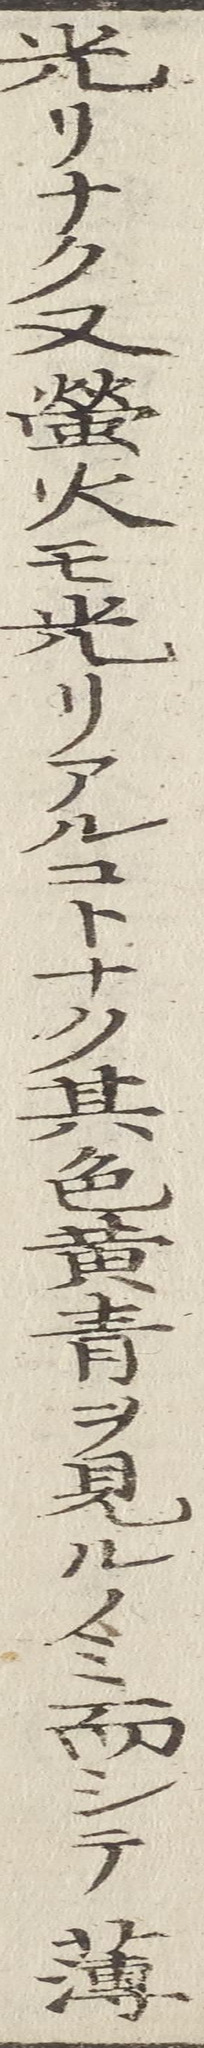光リナク又蛍火モ光リアルコトナク其色黄青ヲ見ルノミ而シテ薄
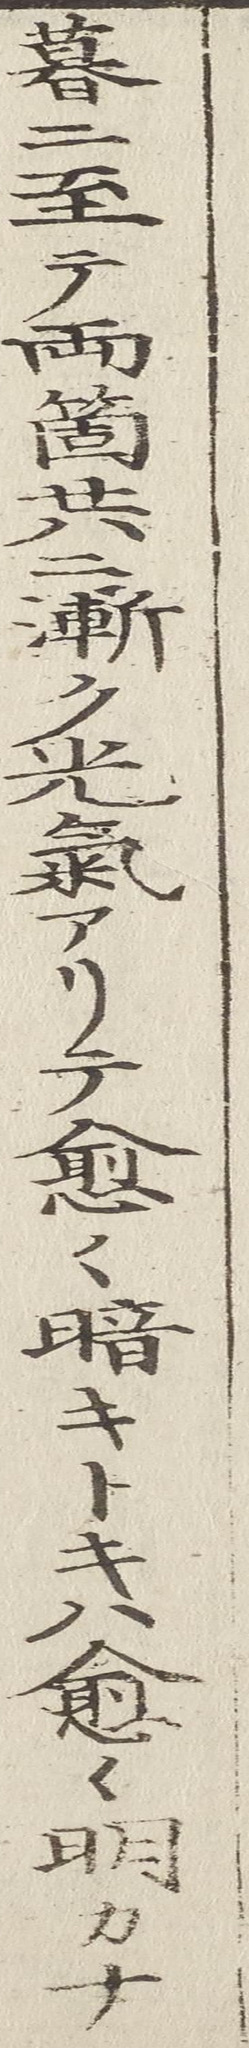暮ニ至テ両箇共ニ漸ク光気アリテ愈〱暗キトキハ愈〱明カナ
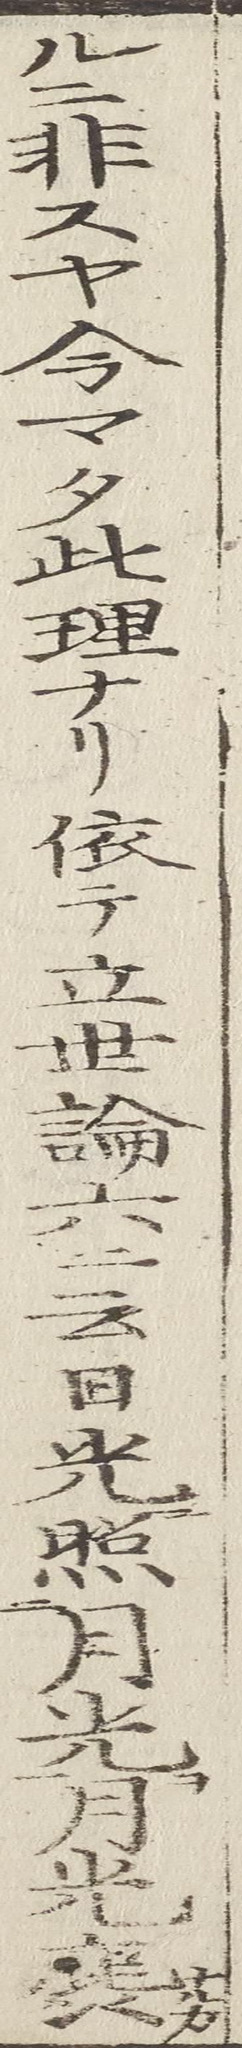ルニ非スヤ今マタ此理ナリ依テ立世論六ニ云日光照ニ月光月光麤

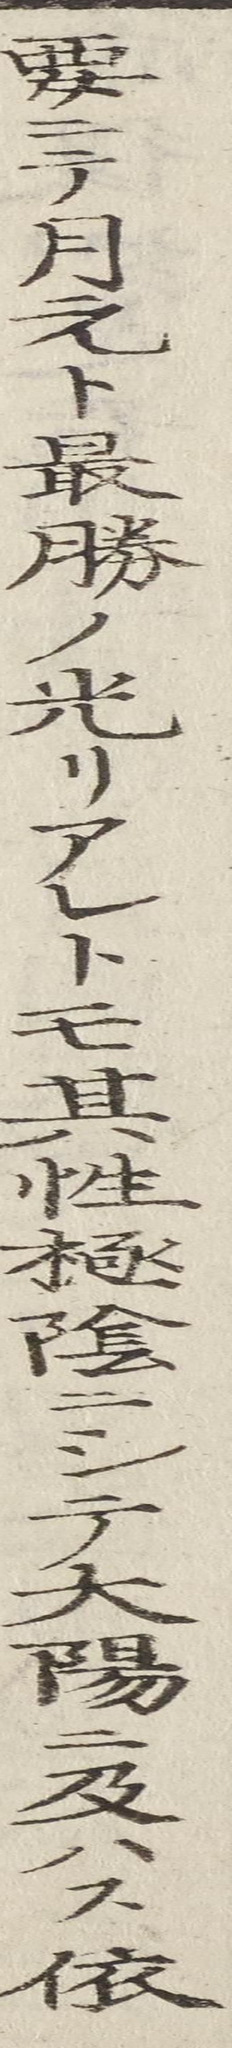要ニテ月元ト最勝ノ光リアレトモ其性極陰ニシテ大陽ニ及ハス依
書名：護法新論　二編　中
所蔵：東京大学地震研究所図書室 Earthquake Research Institute Library, The University of Tokyo, JAPAN
